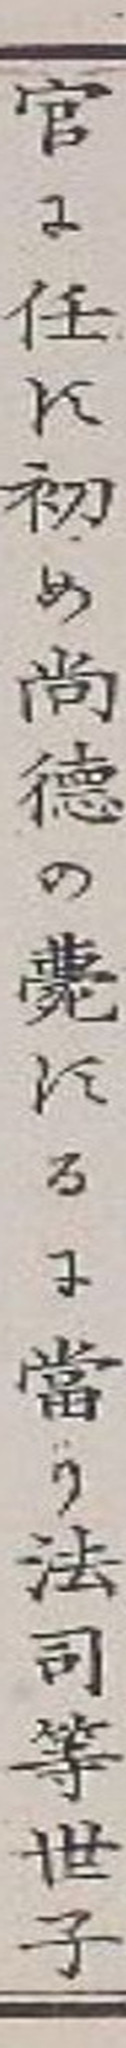官に任す初め尚徳の薨するに当り法司等世子
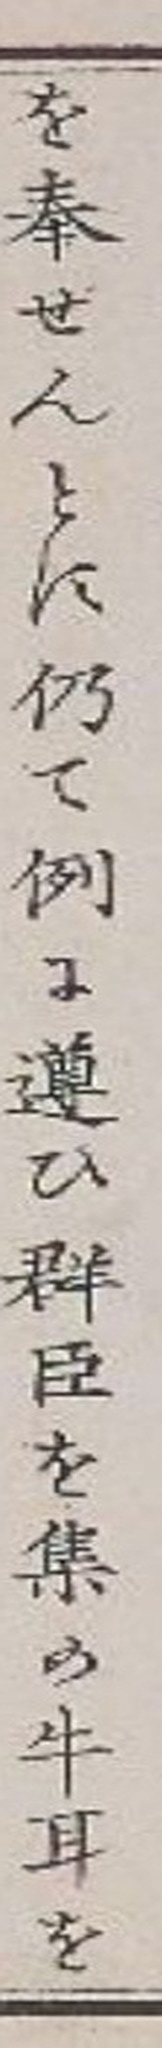を奉せんとす仍て例に遵ひ群臣を集め牛耳を
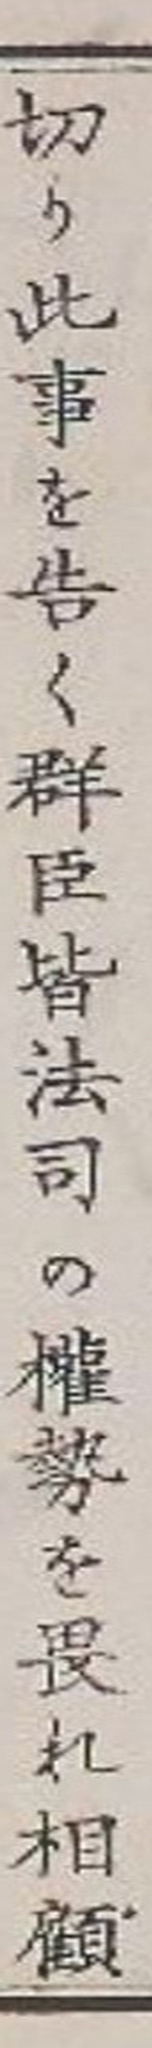切り此事を告く群臣皆法司の権勢を畏れ相顧
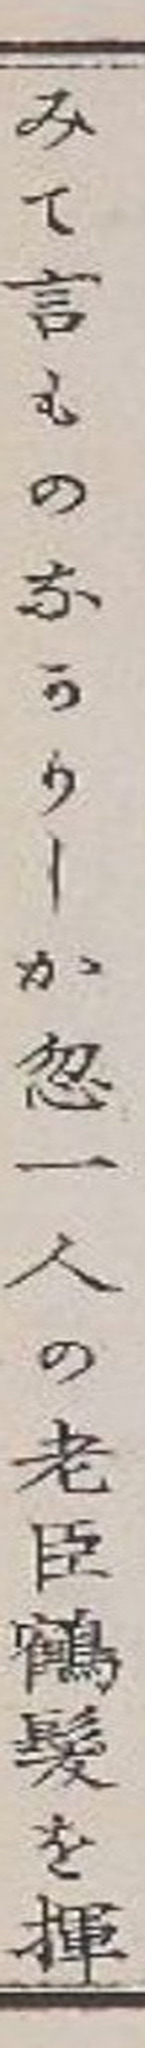みて言ものなかりしか忽一人の老臣鶴髪を揮
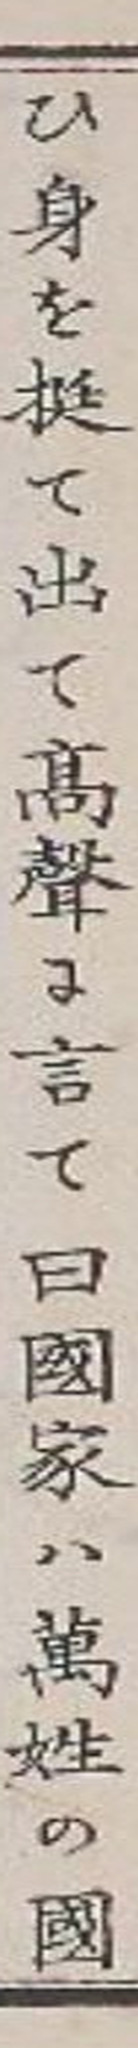ひ身を挺て出て高声に言て曰国家は万姓の国
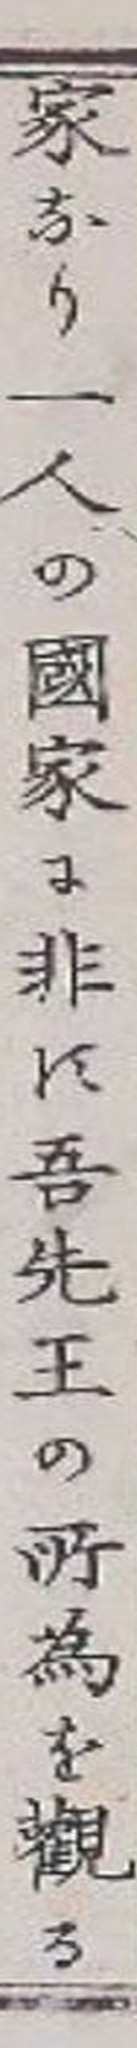家なり一人の国家に非す吾先王の所為を観る
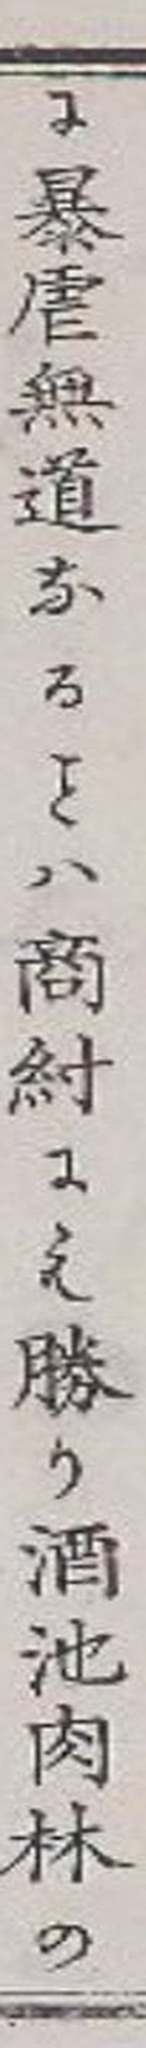に暴虐無道なることは商紂にも勝り酒池肉林の
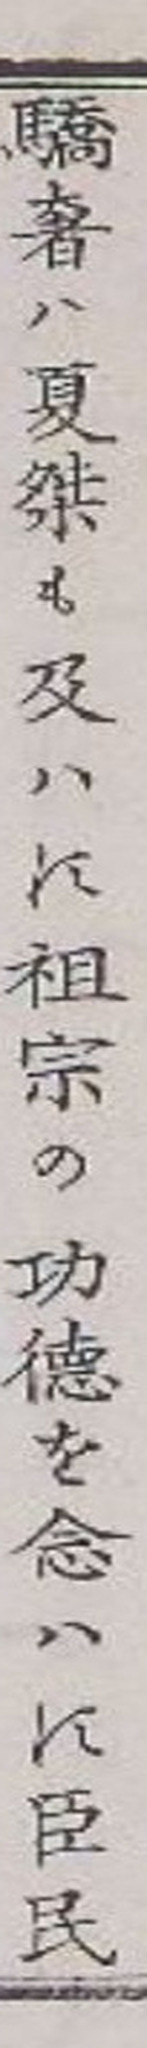驕奢は夏桀も及はす祖宗の功徳を念はす臣民
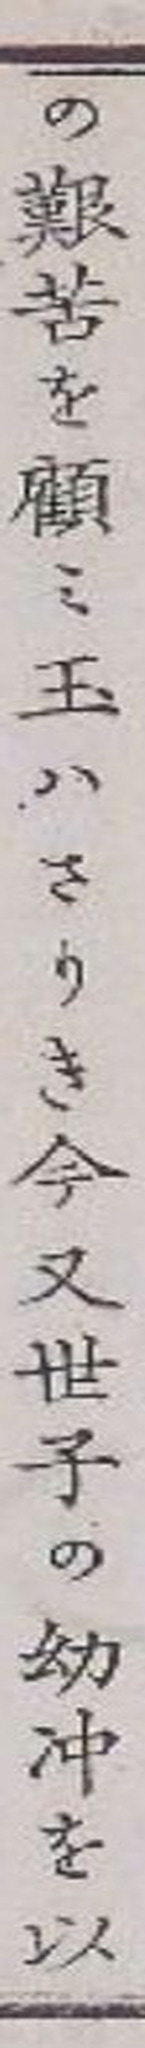の艱苦を顧み玉はさりき今又世子の幼沖を以
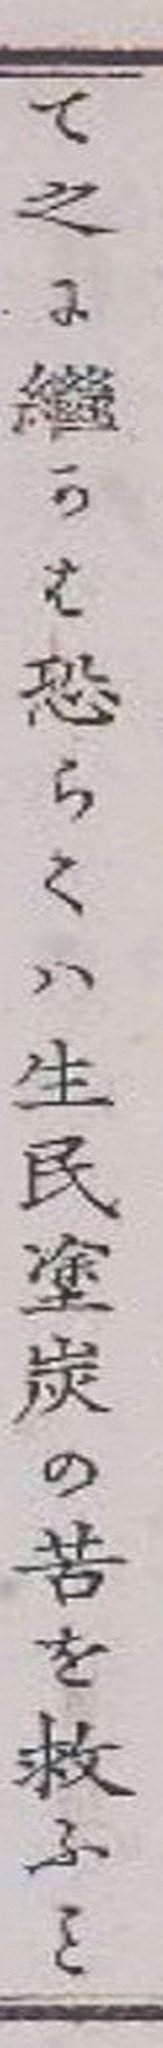て之に継かは恐らくは生民塗炭の苦を救ふこと
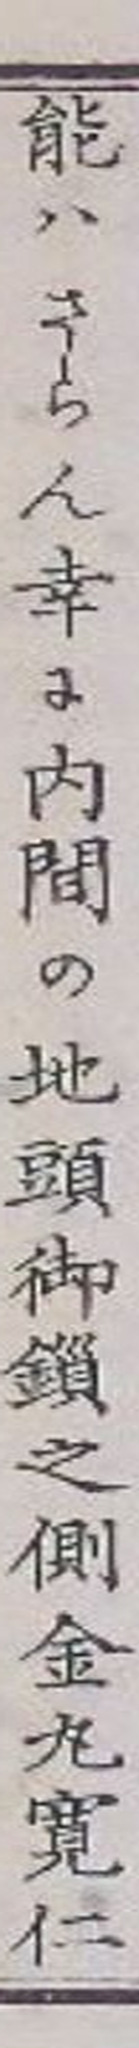能はさらん幸に内間の地頭御鎖之側金丸寛仁
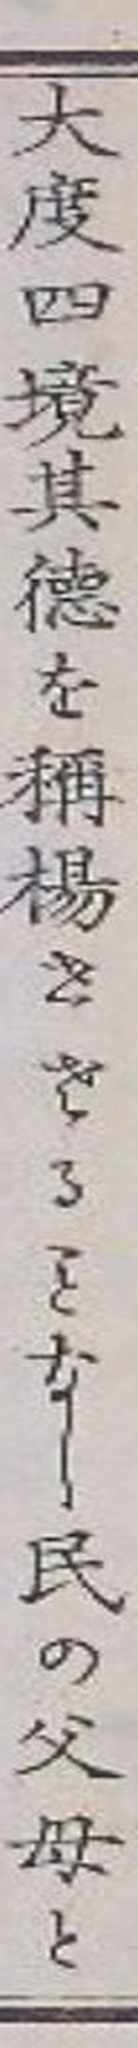大度四境其徳を称楊せさることなし民の父母と
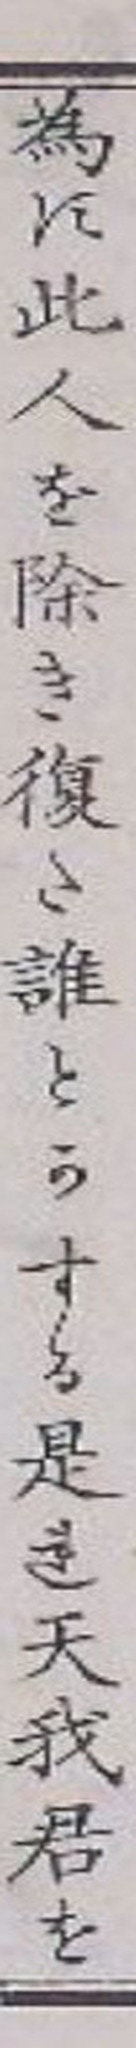為す此人を除き復た誰とかする是れ天我君を
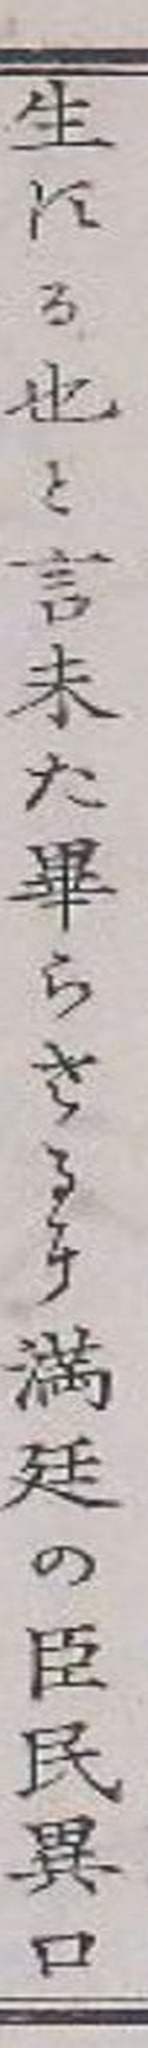生する也と言未た畢らさるに満廷の臣民異口
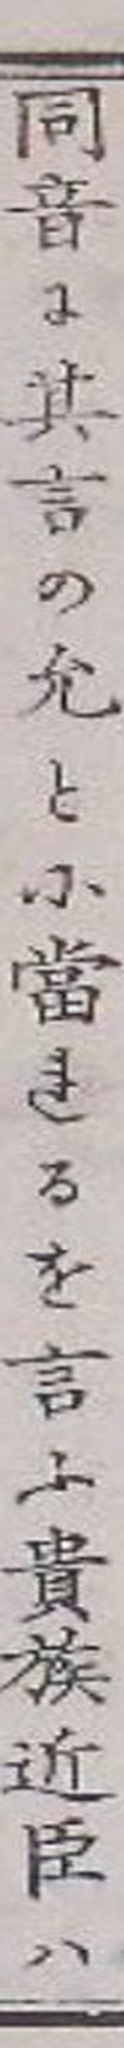同音に其言の允とに当れるを言ふ貴族近臣は

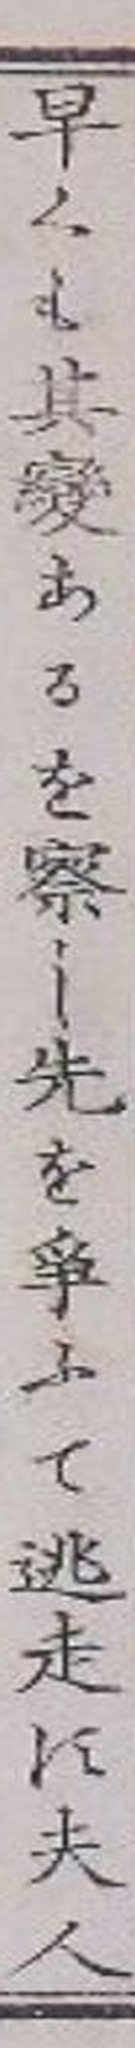早くも其変あるを察し先を争ふて逃走す夫人
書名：南島紀事 中
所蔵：University of the Ryukyus Library
